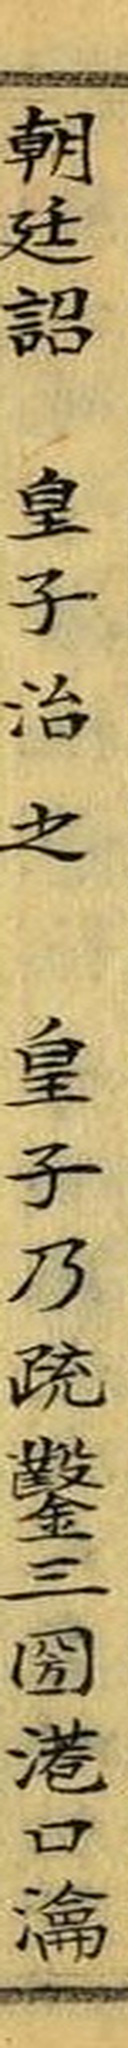朝廷詔皇子治之皇子乃疏鑿三圀港口瀹
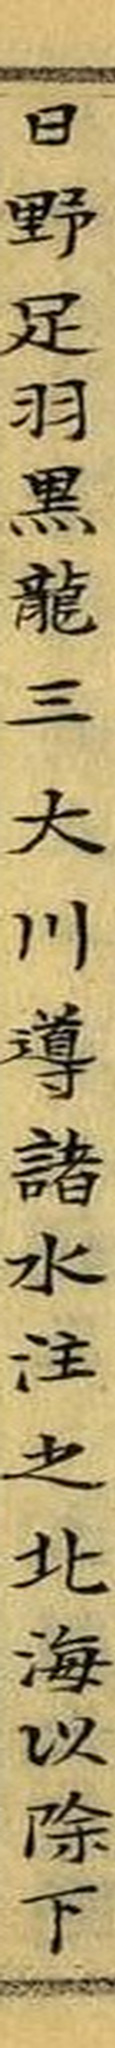日野足羽黒龍三大川導諸水注之北海以除下
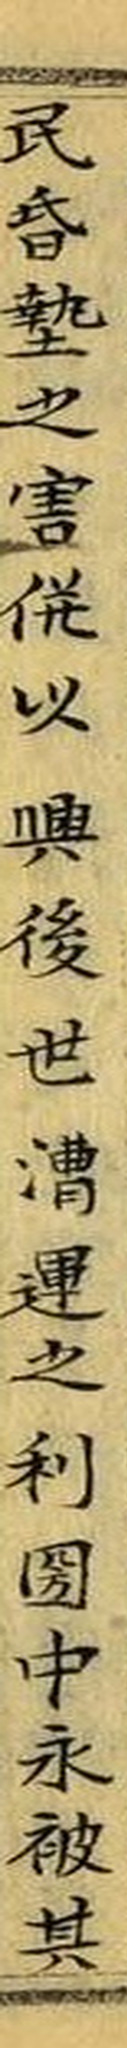民昏墊之害併以興後世漕運之利圀中永被其
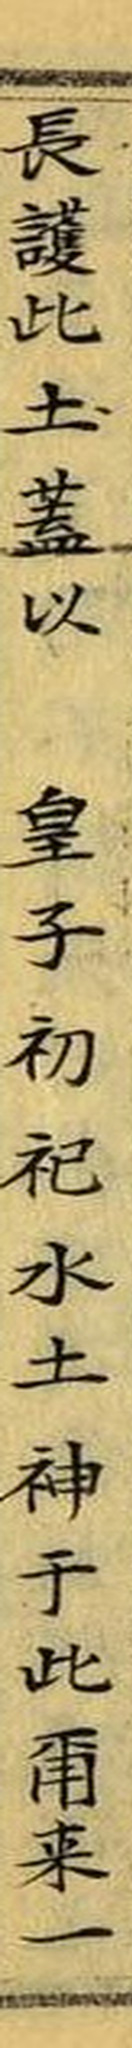長護此土蓋以皇子初祀水土神于此爾来一
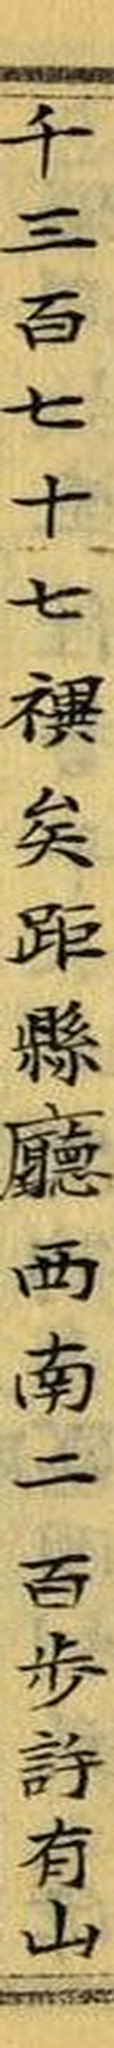千三百七十七禩矣距縣廳西南二百歩許有山
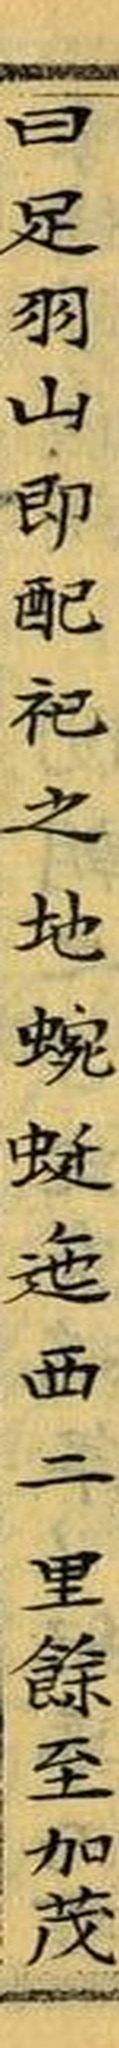曰足羽山即配祀之地蜿蜒迤西二里餘至加茂
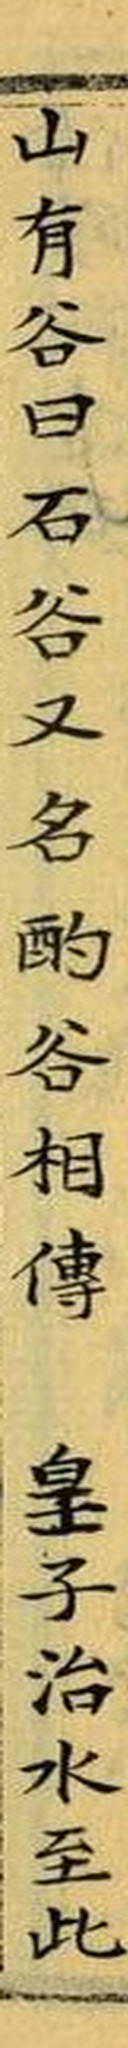山有谷曰石谷又名酌谷相傳皇子治水至此
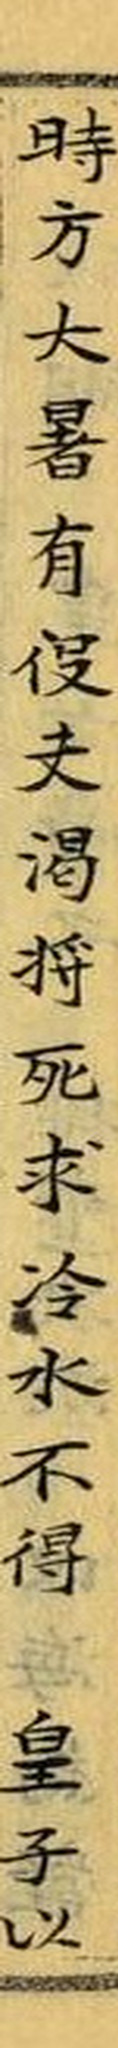時方大暑有伇夫渇将死求冷水不得皇子以
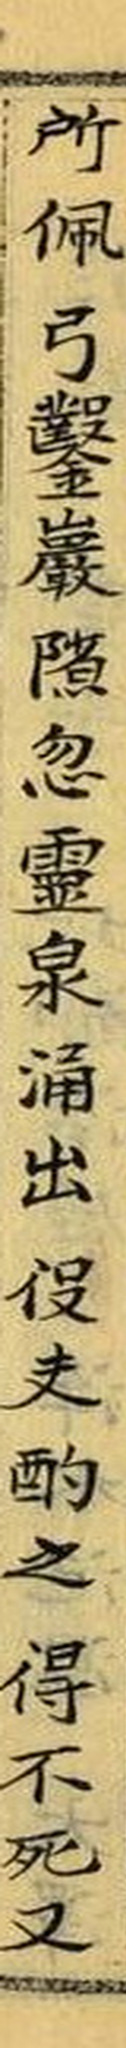所佩弓鑿巖隙忽霊泉涌出伇夫酌之得不死又
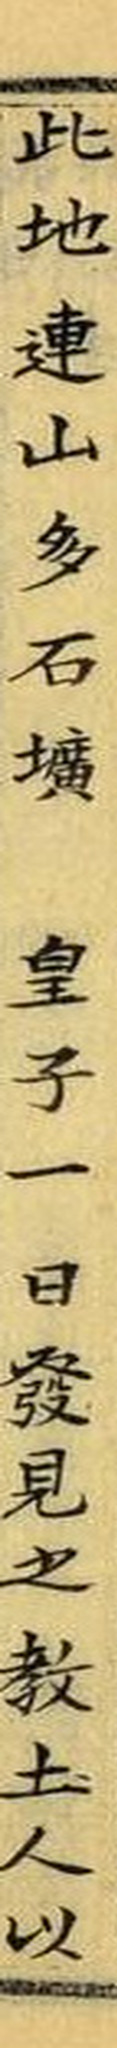此地連山多石壙皇子一日發見之教土人以
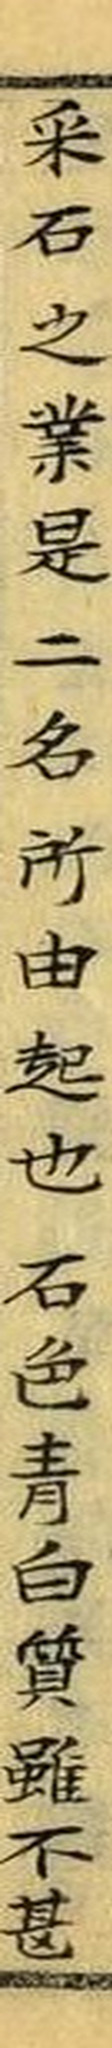采石之業是二名所由起也石色青白質雖不甚
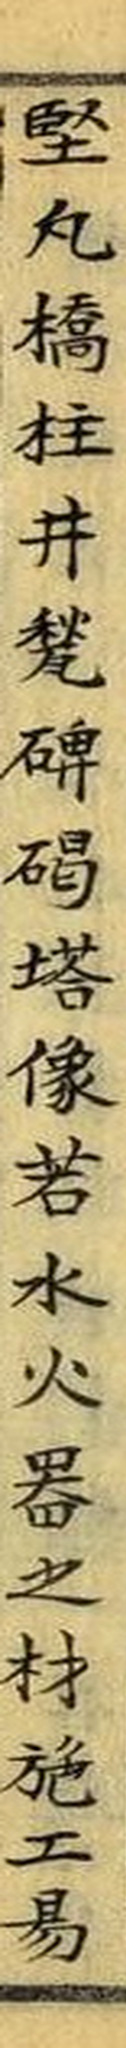堅凡橋柱并甃碑碣塔像若水火器之材施工易
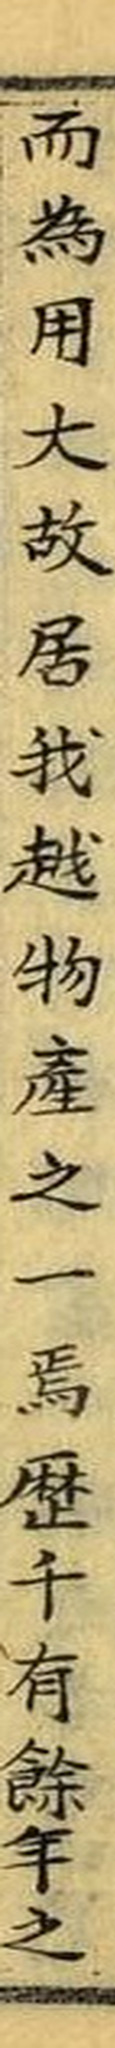而為用大故居我越物産之一焉歴千有餘年之
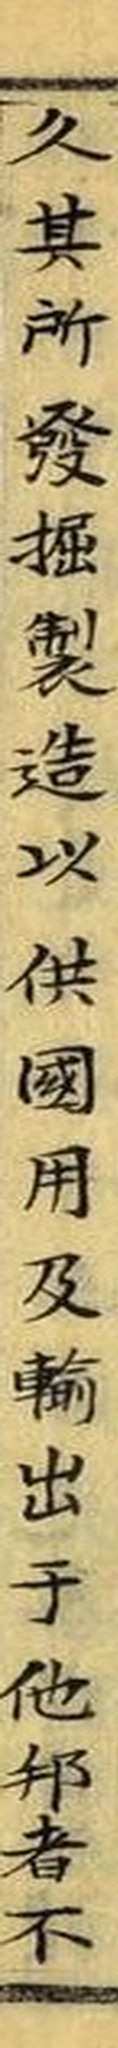久其所發掘製造以供國用及輸出于他邦者不
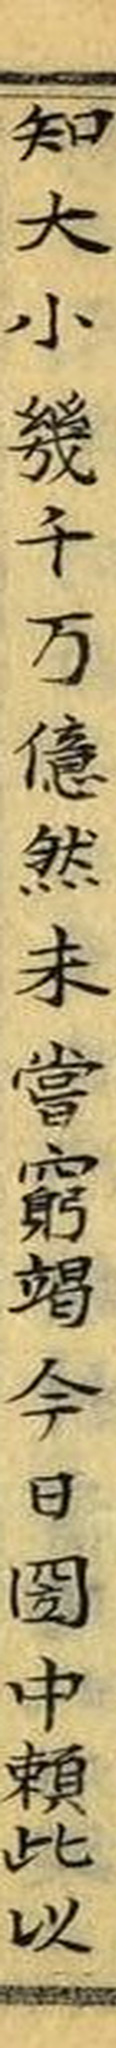知大小幾千万億然未嘗窮竭今日圀中頼此以
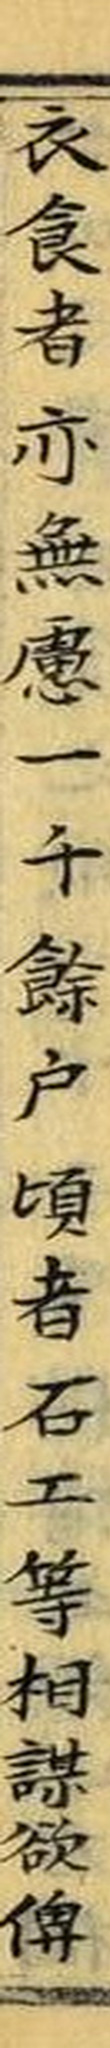衣食者亦無慮一千餘戸頃者石工等相謀欲俾
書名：温古集 五巻
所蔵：福井県文書館 Fukui Prefectural Archives
